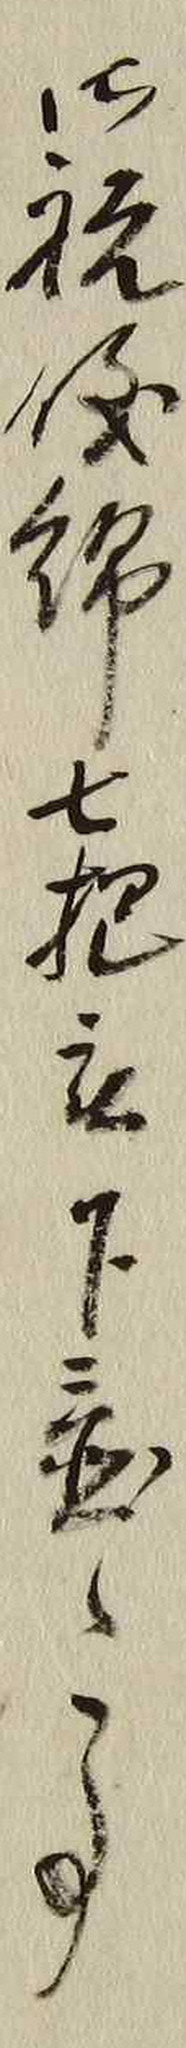御祝儀綿七把被下置候事
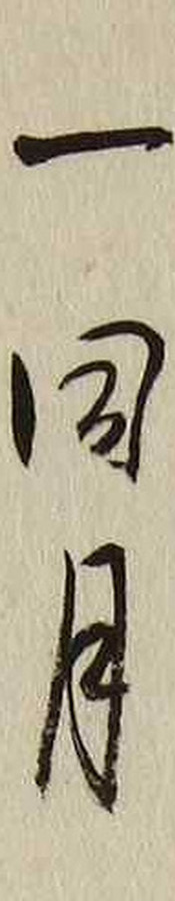一同月
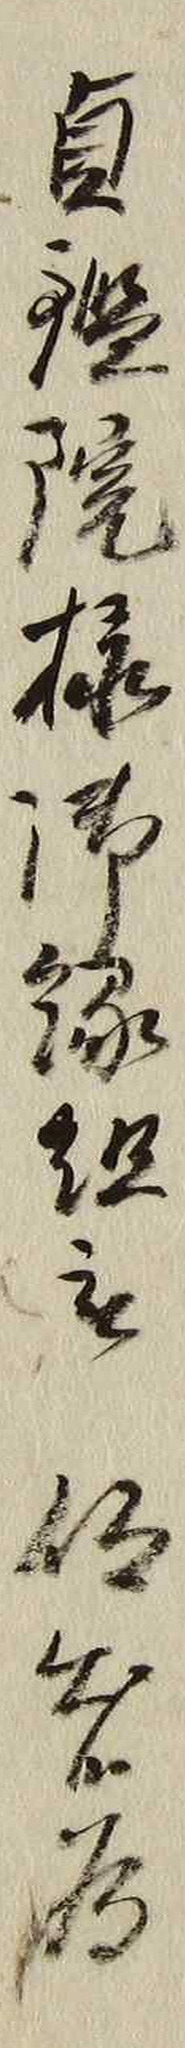貞鑑院様御縁組被仰出候為
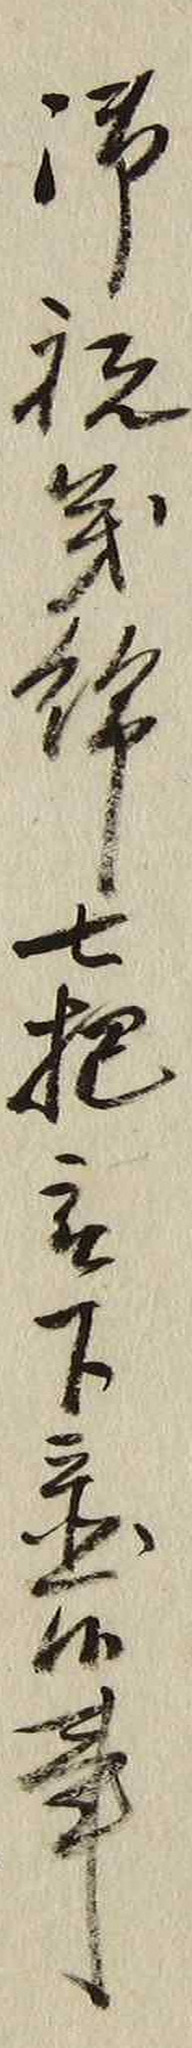御祝儀綿七把被下置候事
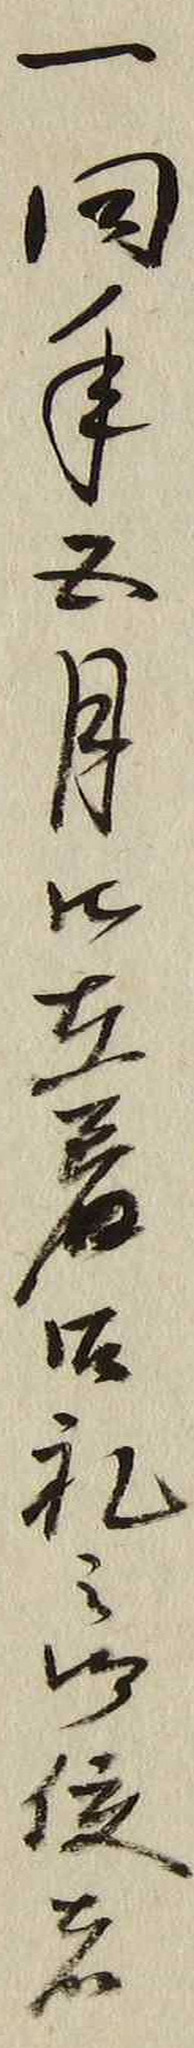一同年五月御在着御礼之御使者
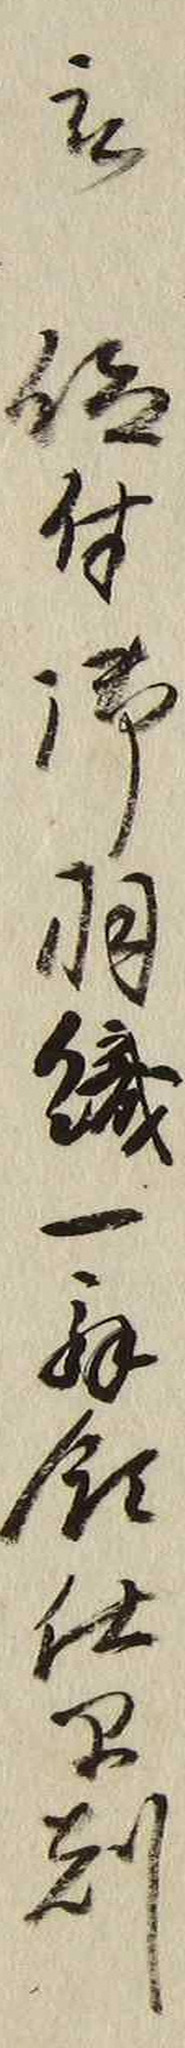被仰付御羽織一拝領仕早刻
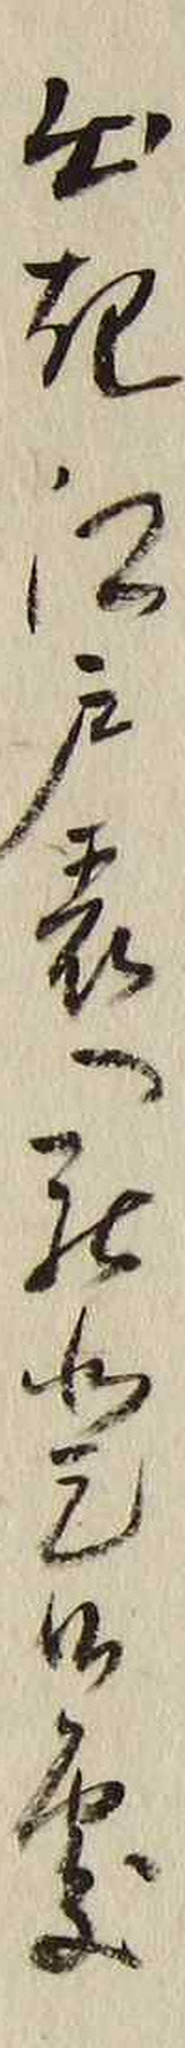出起江戸表へ罷登候処

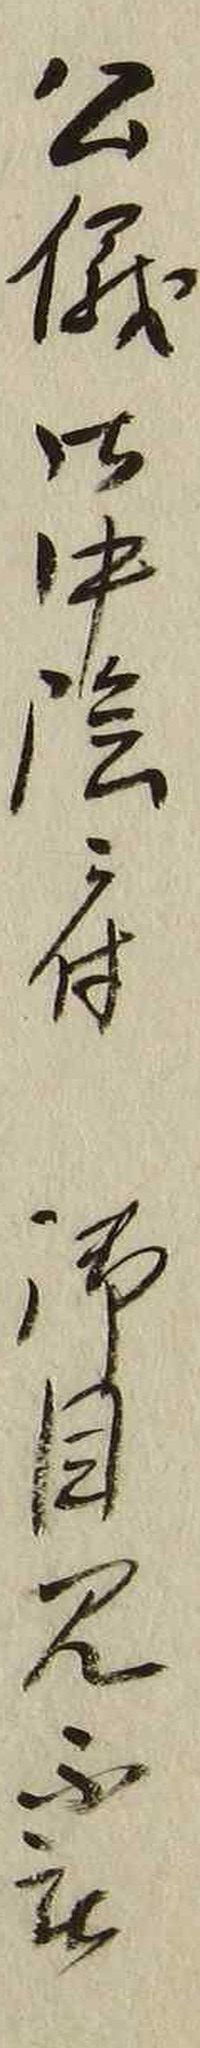公儀御中陰ニ付御目見不被
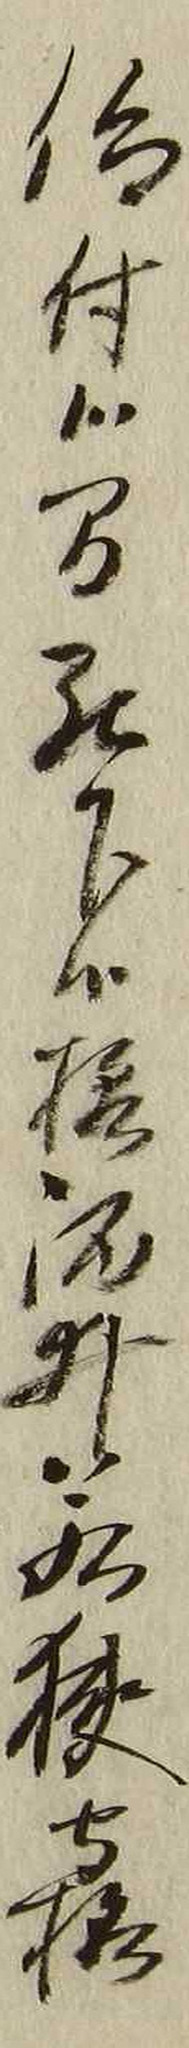仰付候間罷下候様酒井若狭守様
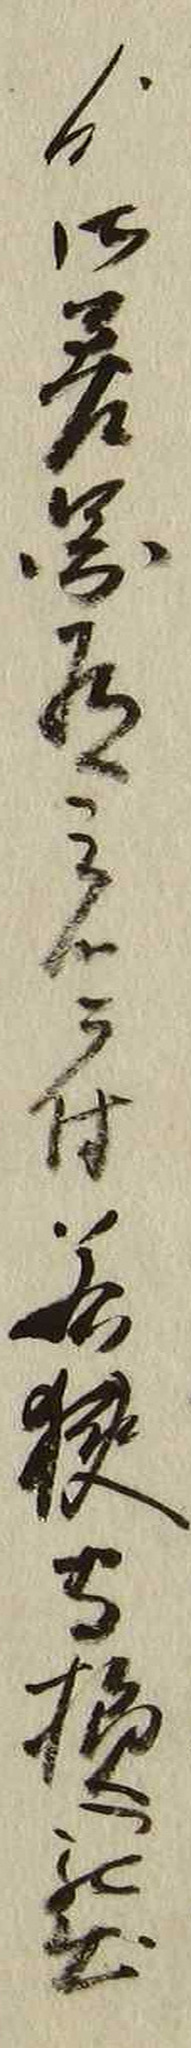ゟ御差図有之候ニ付若狭守様へ罷出
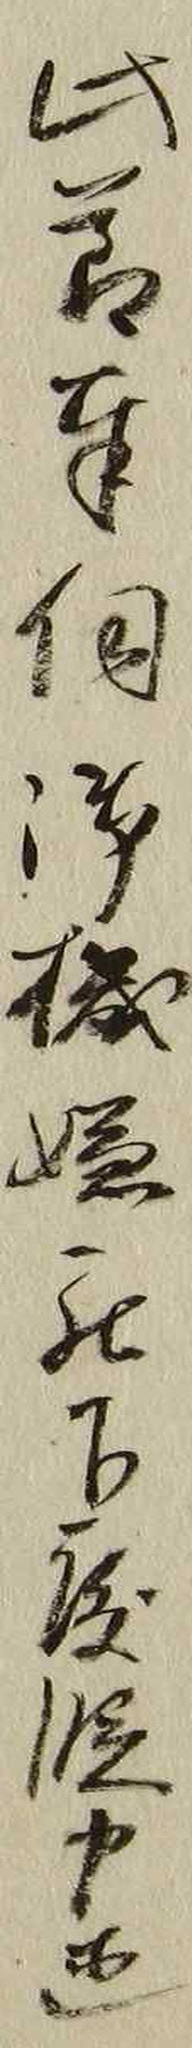此節奉伺御機嫌罷下度段申述
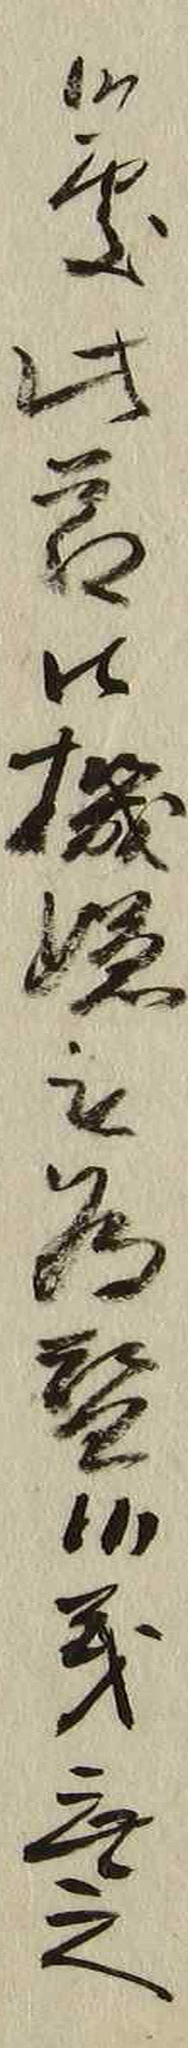候処此節御機嫌被為替候義無之
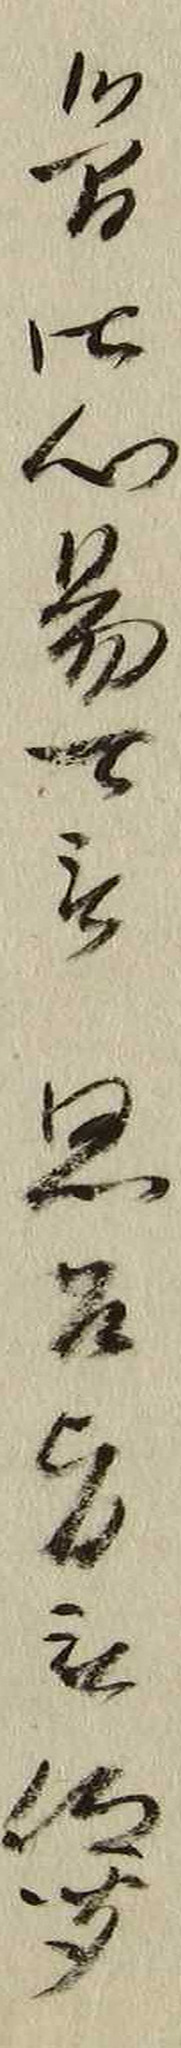候間御心易可被思召旨被仰聞
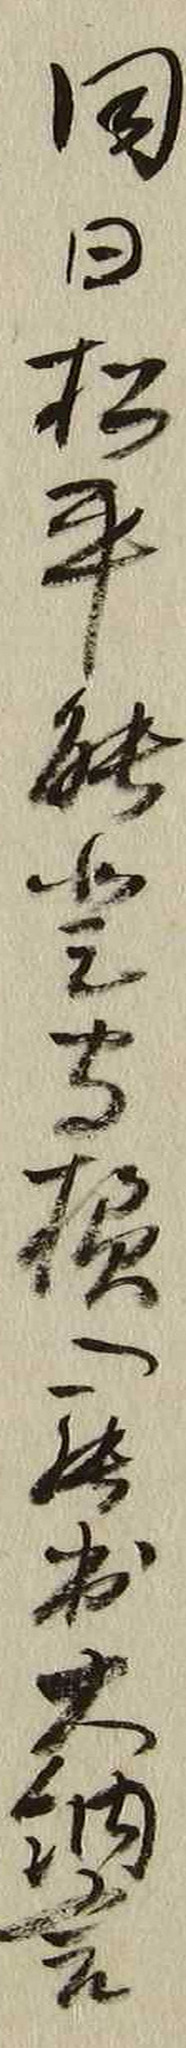同日松平能登守様へ罷出大納言
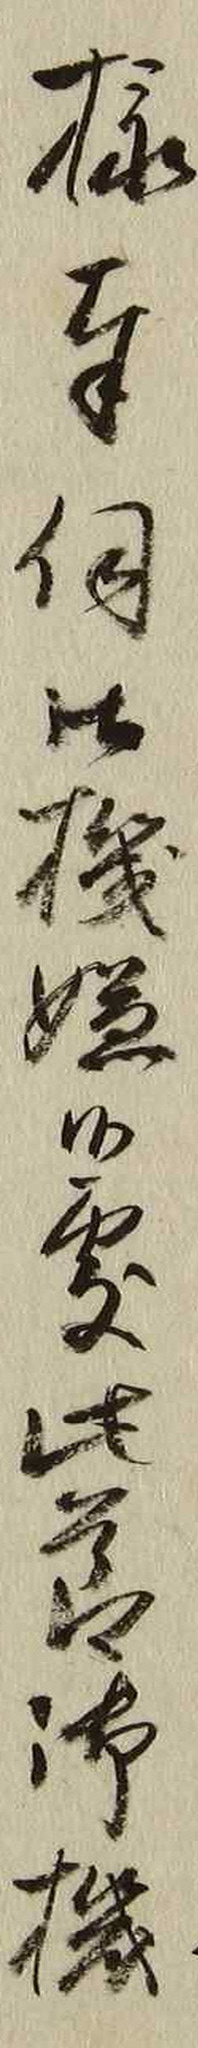様奉伺御機嫌候処此節御機
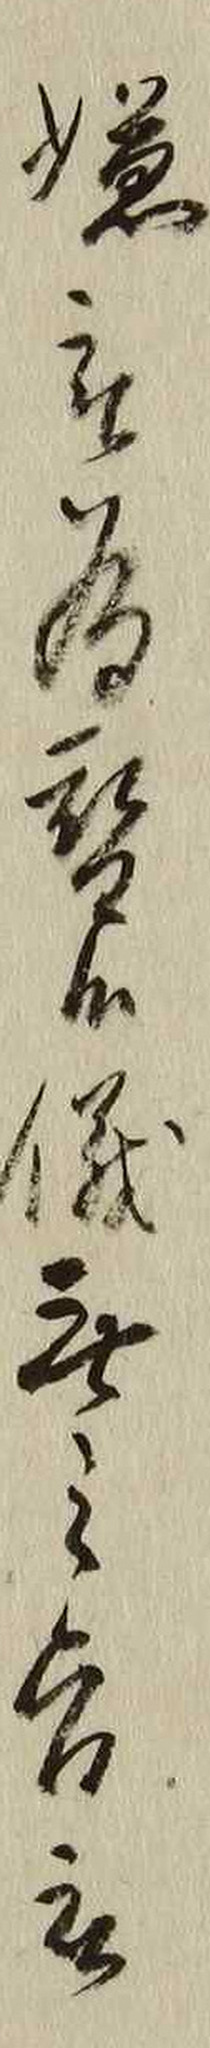嫌被為替候儀無之旨被
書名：諸士系譜　巻之351　す之部1
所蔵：会津若松市立会津図書館
